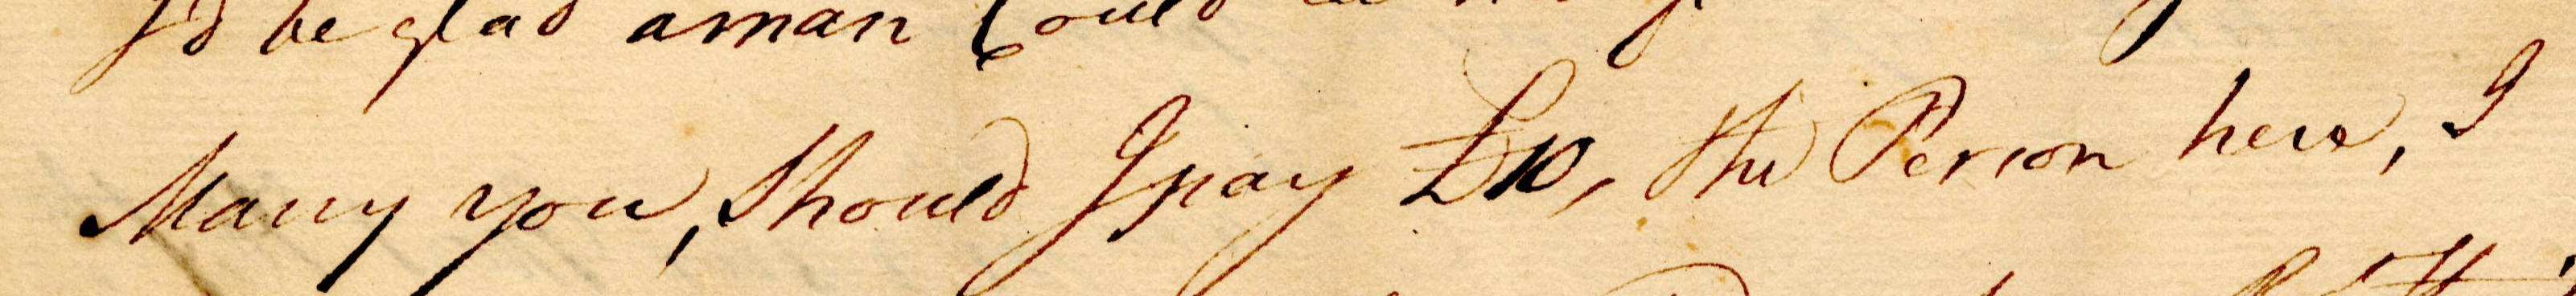Marry you, should I pay £10, the person here, I
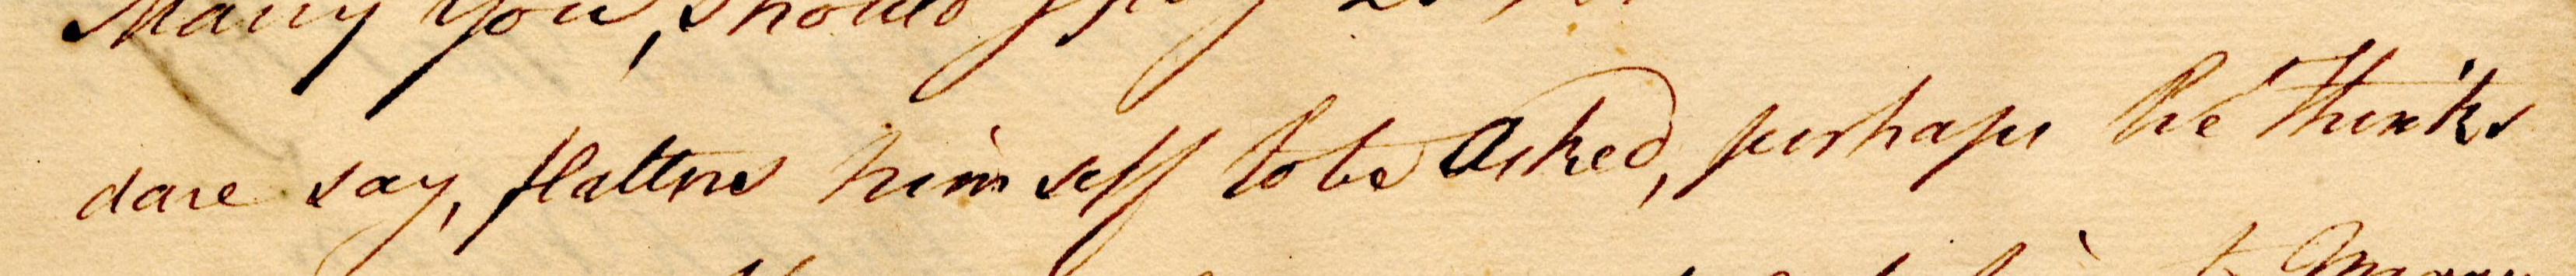dare say, flatters himself to be Asked, perhaps he thinks
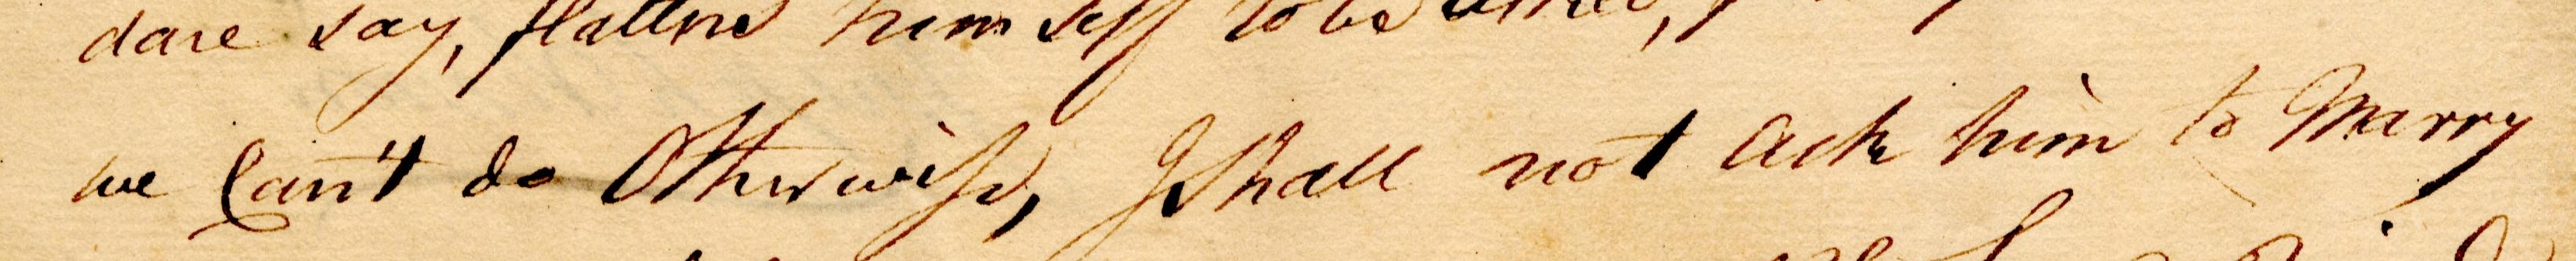we Can't do Otherwise, I shall not Ask him to marry
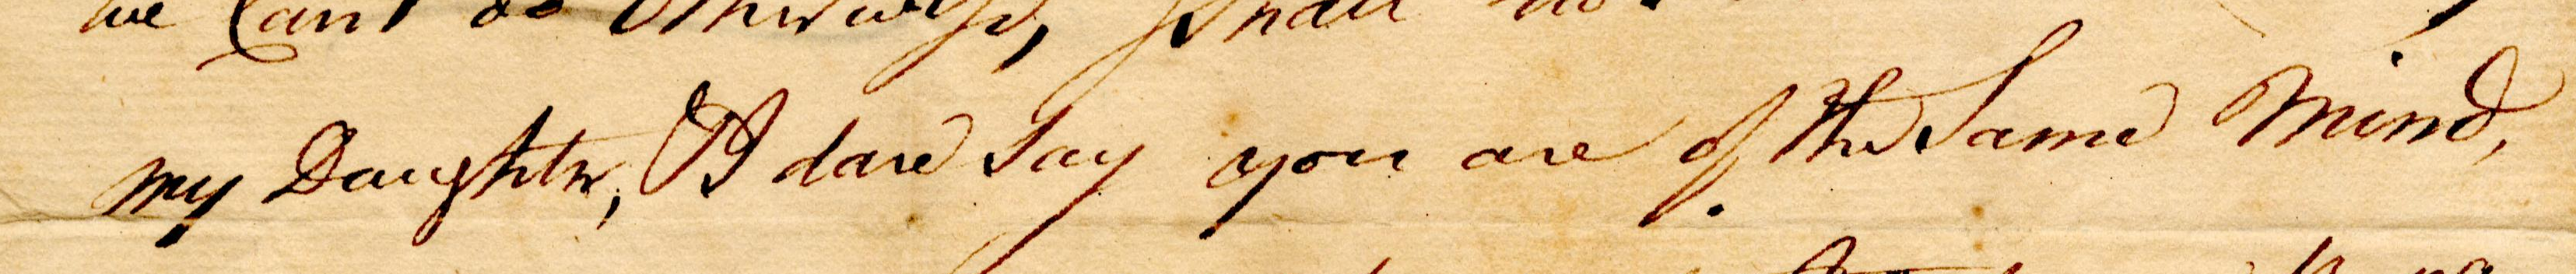my Daughter, & I dare Say you are of the Same Mind,
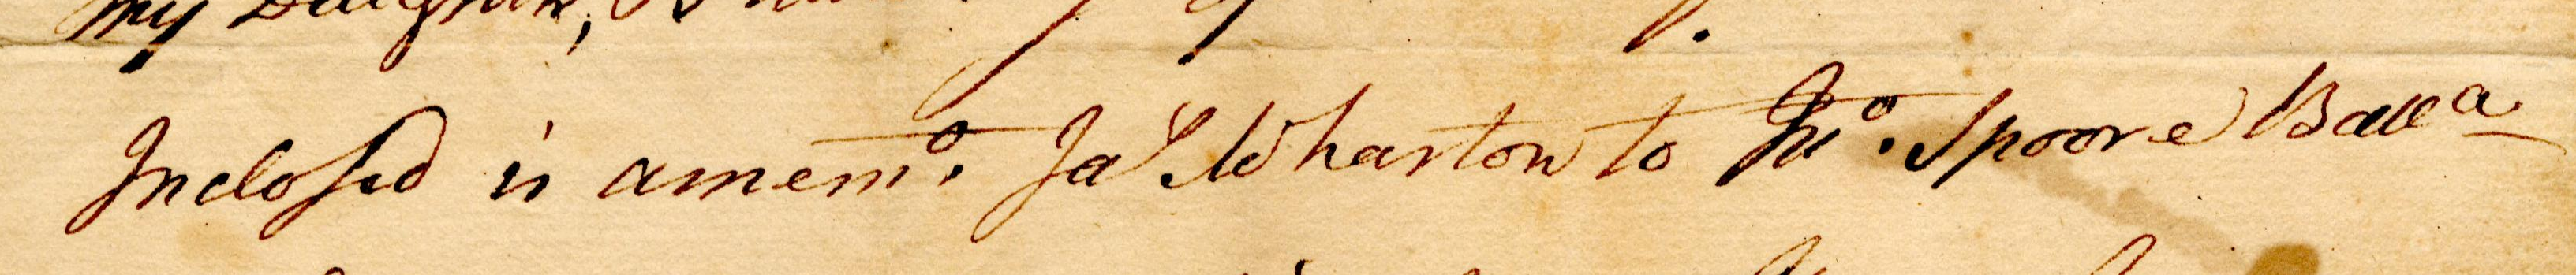Inclosed is amem^o. Jo^s. Wharton to M^r. Spoore Ball^ce
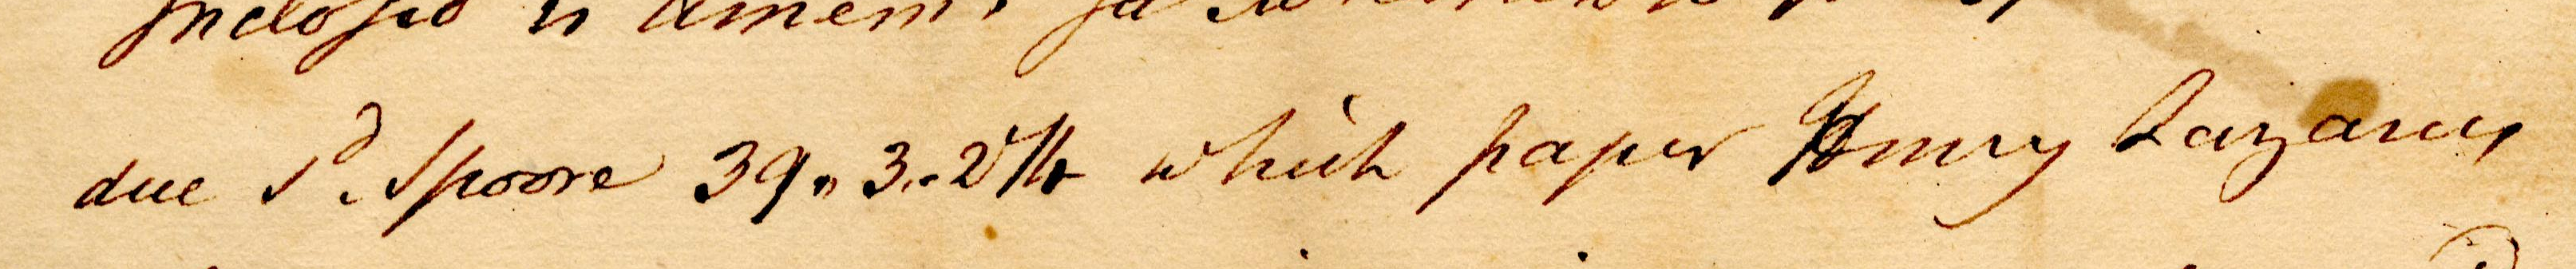due s^d. Spoore 39..3..27s. which paper Henry Lazarus
